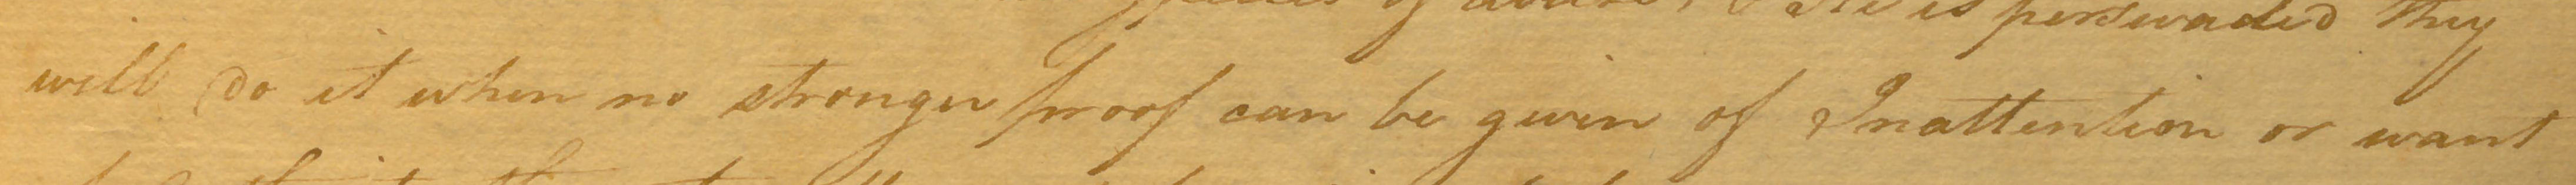will do it when no stronger proof can be given of Inattention or want
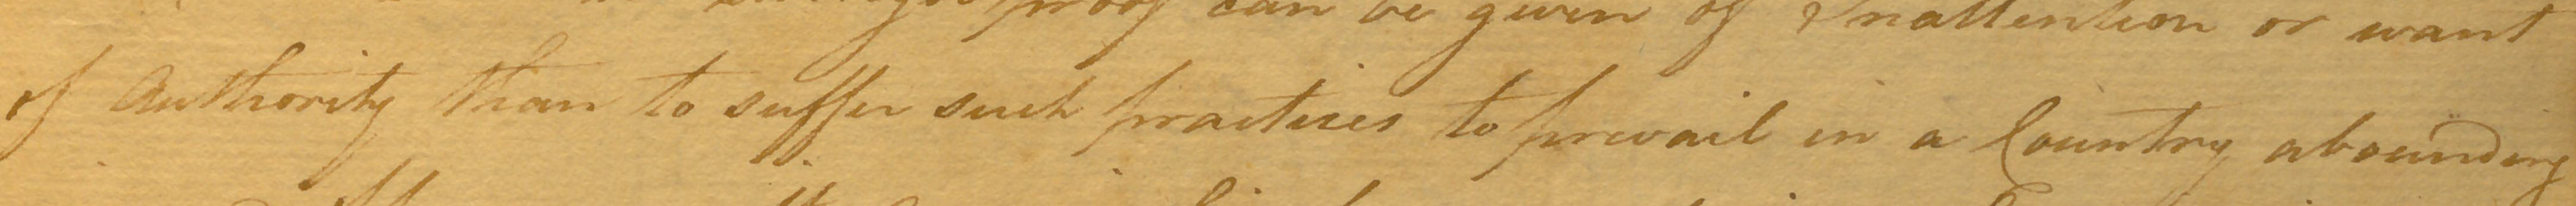of Authority than to suffer such practices to prevail in a Country abounding
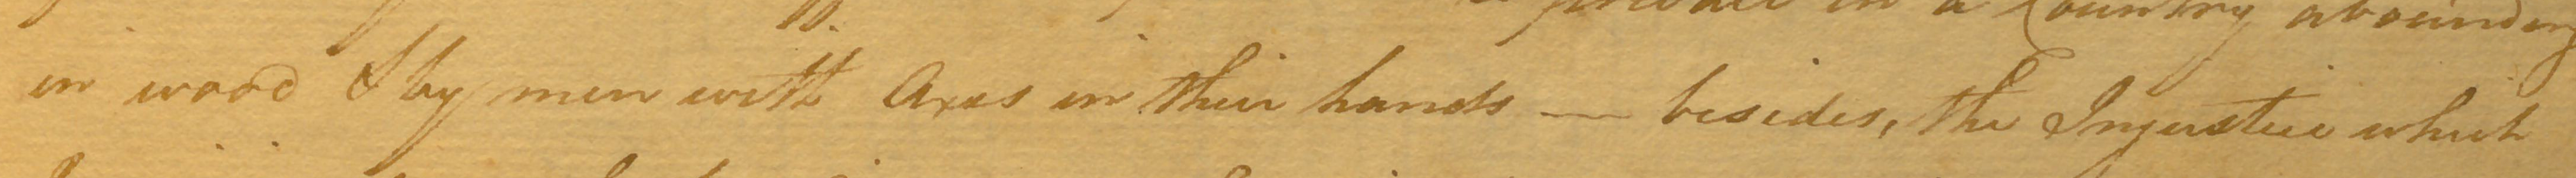in wood & by men with Axes in their hands- besides, the Injustice which
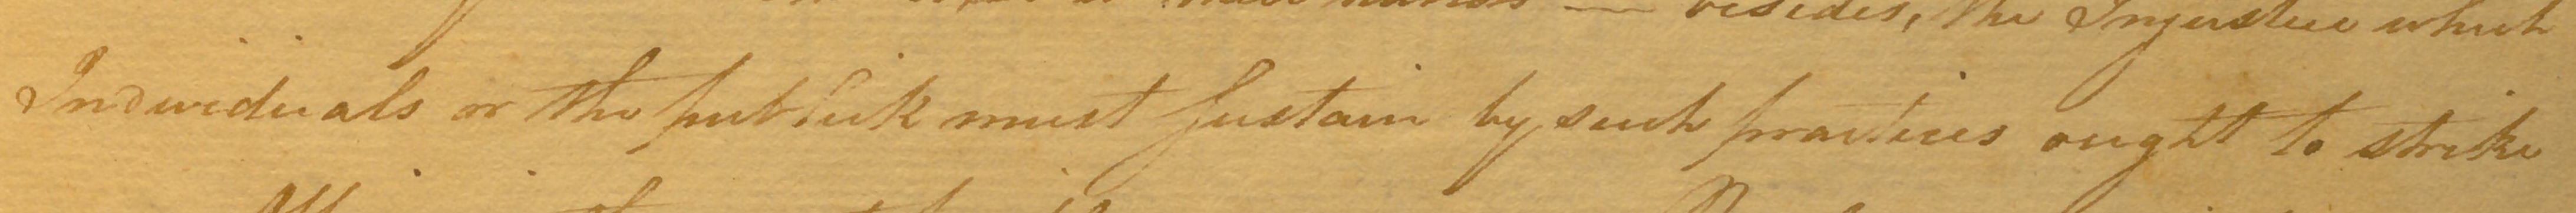Individuals or the publick must sustain by such practices ought to strike
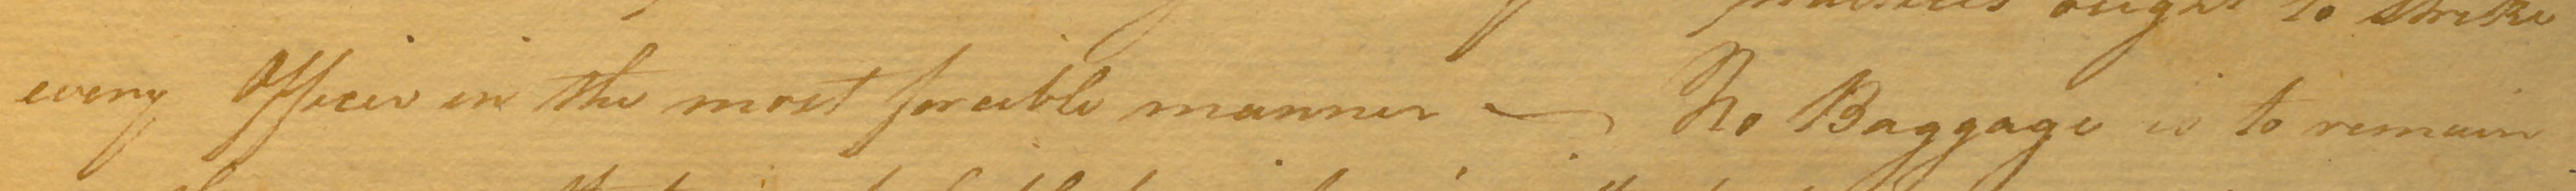every Officer in the most forcible manner- No Baggage is to remain
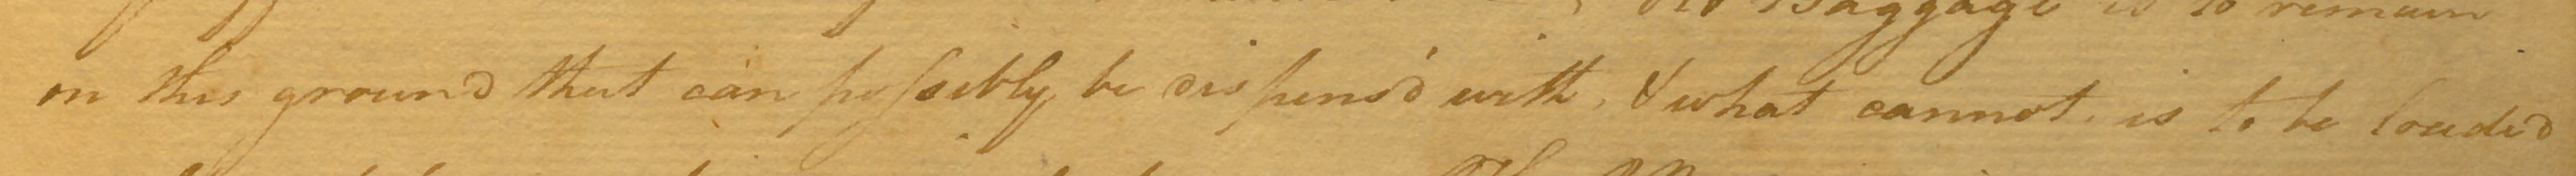in the ground that can possibly be dispens'd with & what cannot is to be loaded
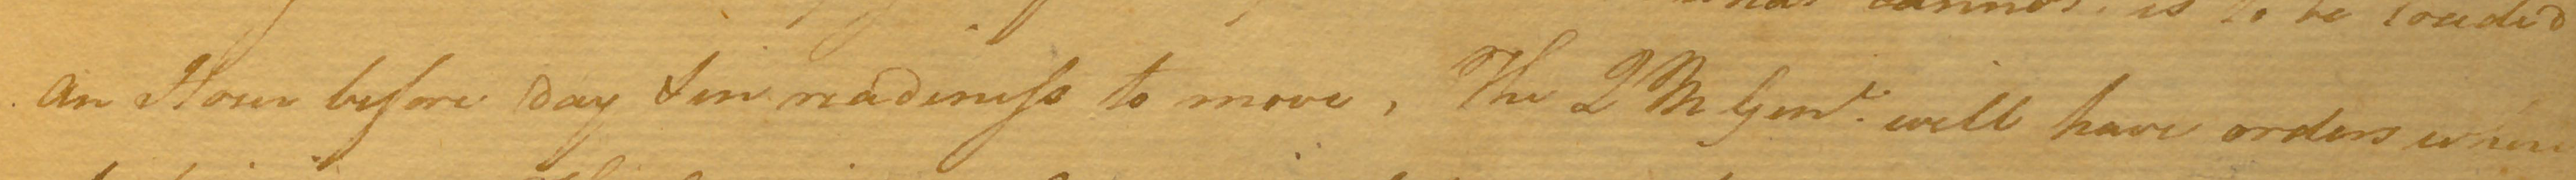an Hour before day & in readiness to move, The Q M Gen^l. will have orders where
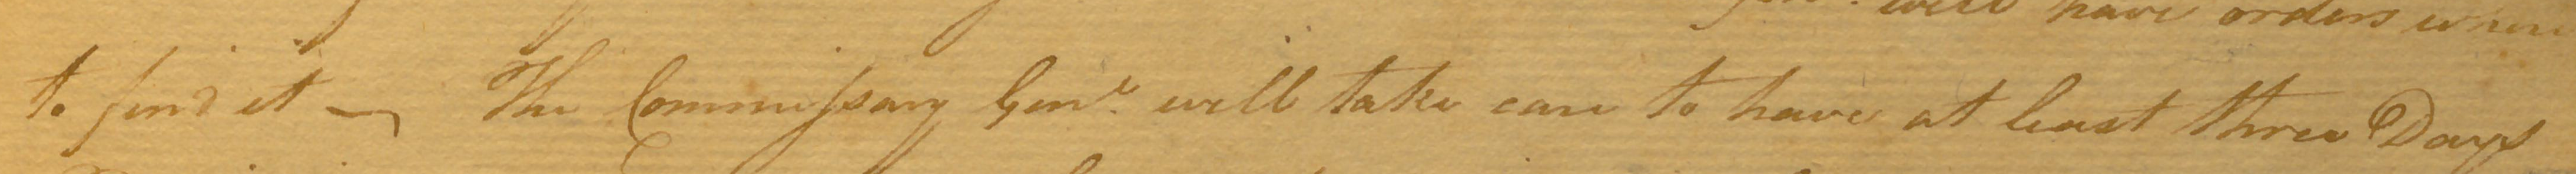to find it- The Commissary Gen^l. will take care to have at least three Days
